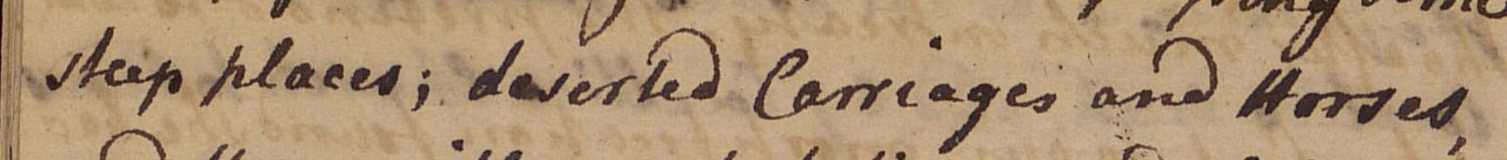steep places; deserted Carriages and Horses,
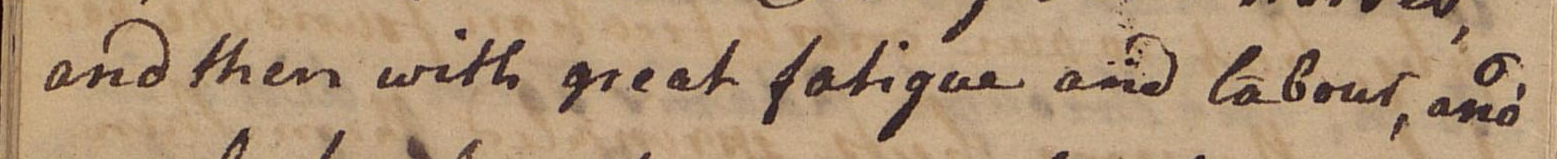and then with great fatigue and labour, and
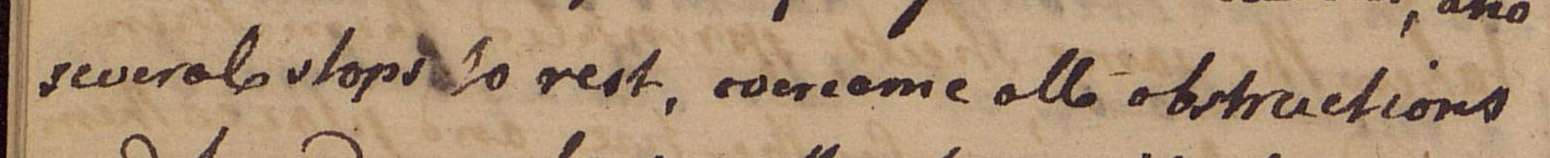several stops to rest, overcame all obstructions
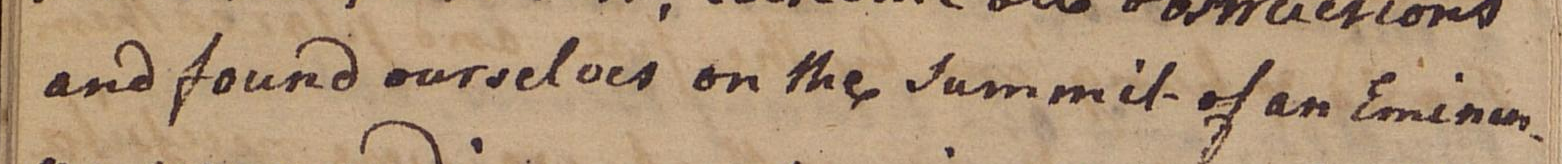and found ourselves on the Summit of an Eminen-
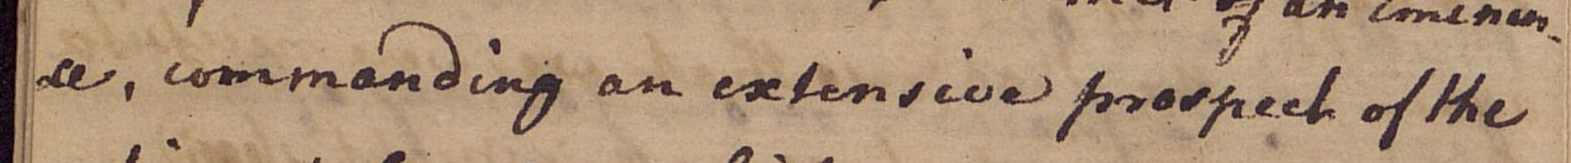-ce, commanding an extensive prospect of the
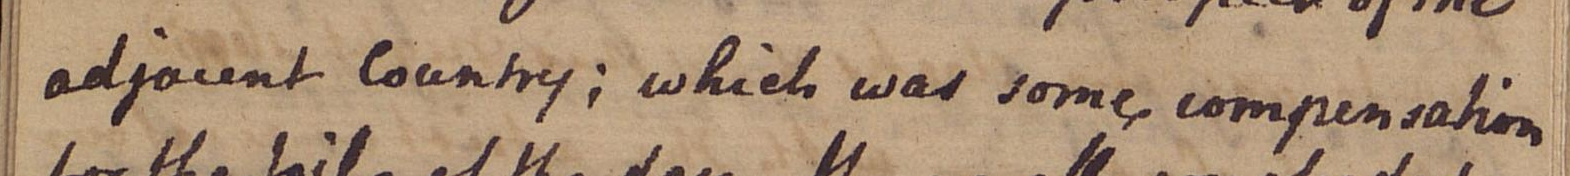adjacent Country; which was some compensation
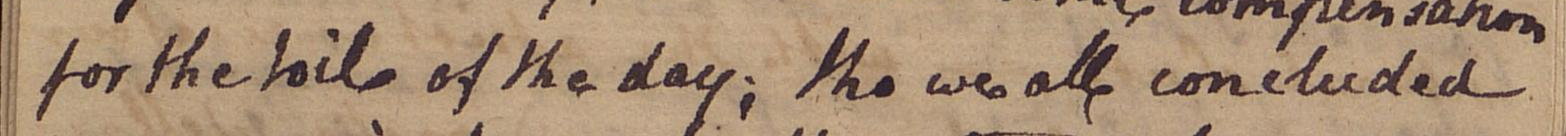for the toils of the day; tho we all concluded
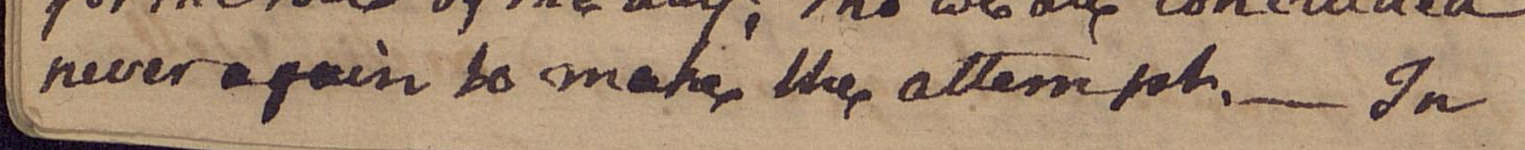never again to make the attempt.- In
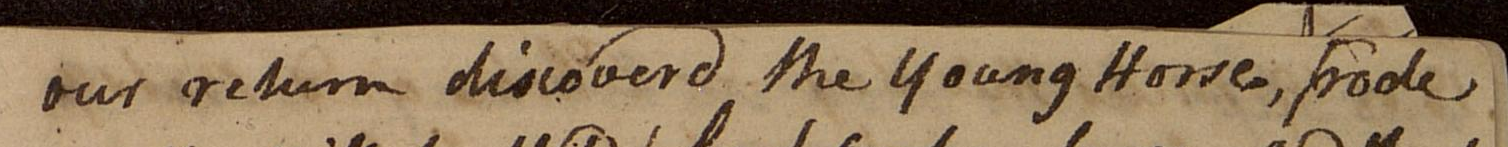our return discover'd the Young Horse, [_]rode
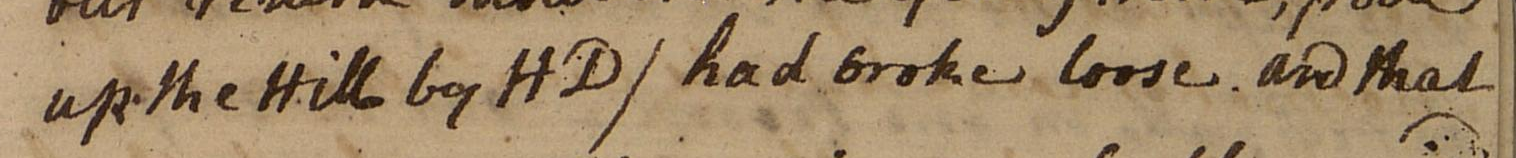upthe Hill by HD / had broke loose and that
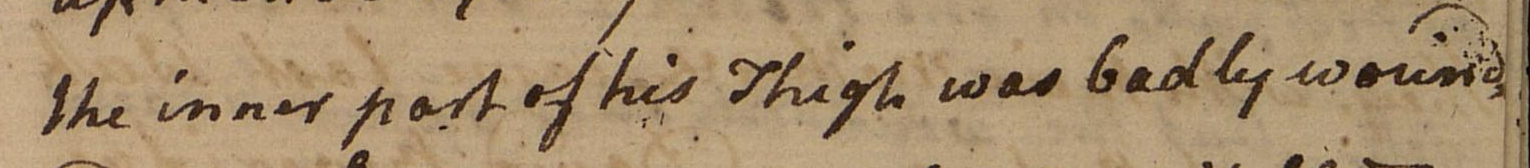the inner part of his Thigh was badly wound
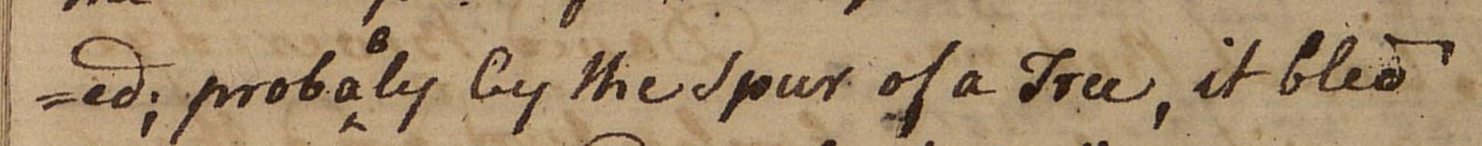-ed; proba^bly by the spur of a Tree, it bled
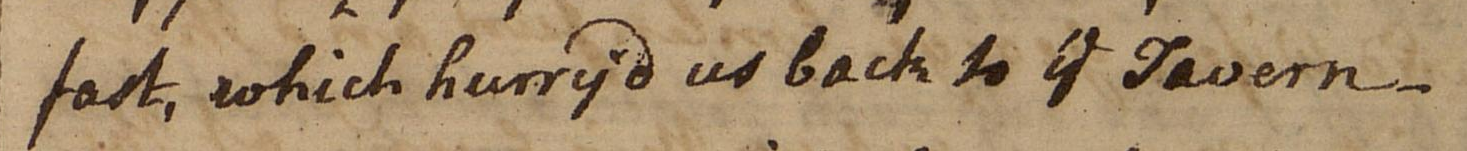fast, which hurry'd us back to it? Tavern-
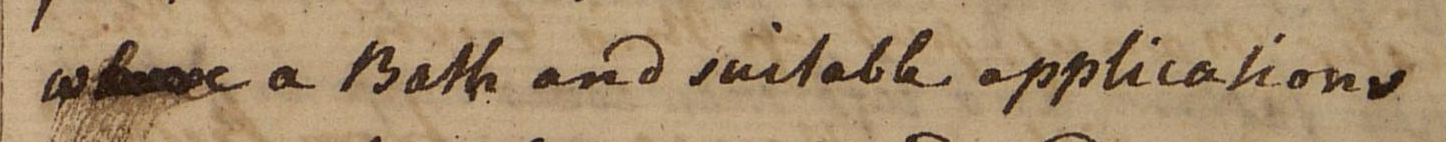where a Bath and suitable applications
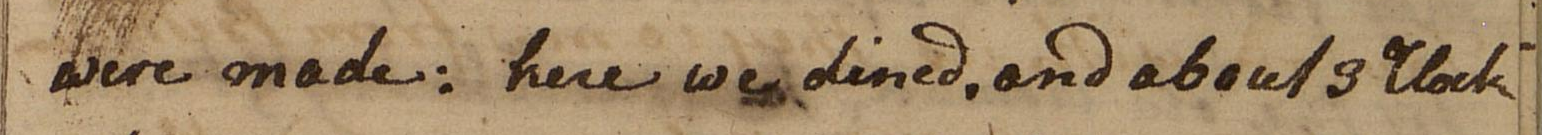were made: here we dined, and about 3 oClock
